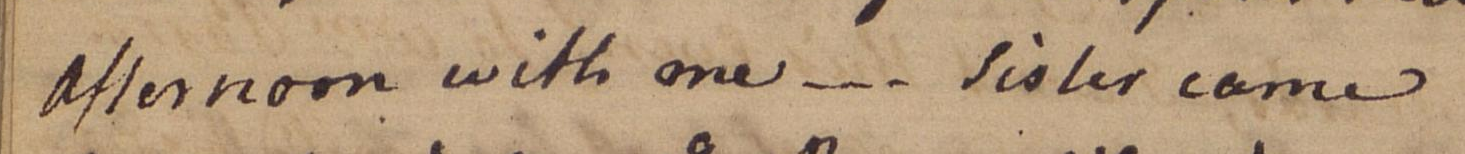Afternoon with one-- Sister came
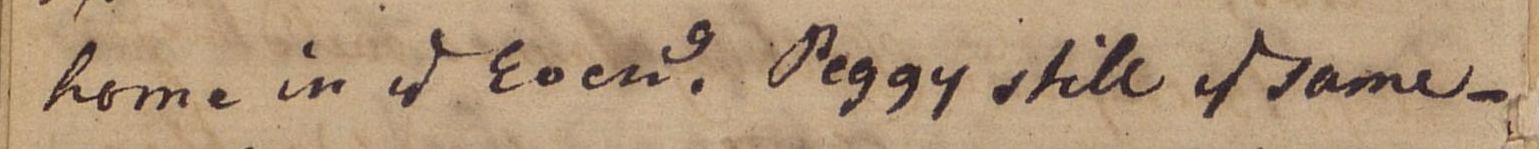home in y^e Even^g. Peggy still y^e same-
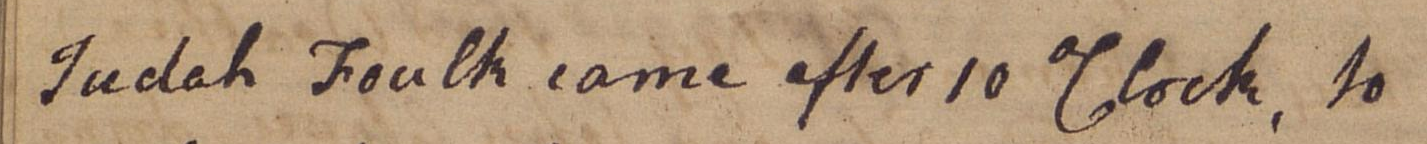Judah Foulk came after 10 oClock, to
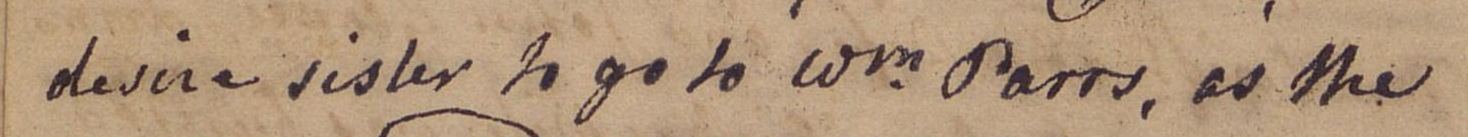desire sister to go to W^m. Parrs, as the
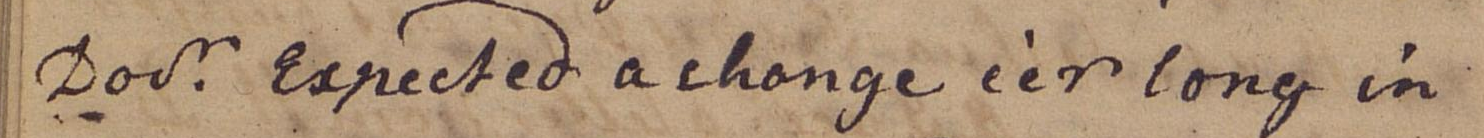Doc^r. Expected a change ier? long in
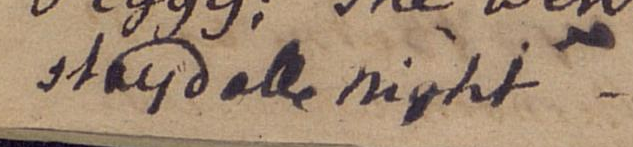stay'd all night -
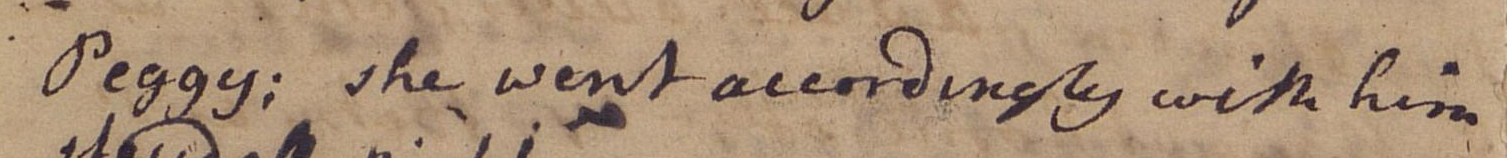Peggy; she went accordingly with him
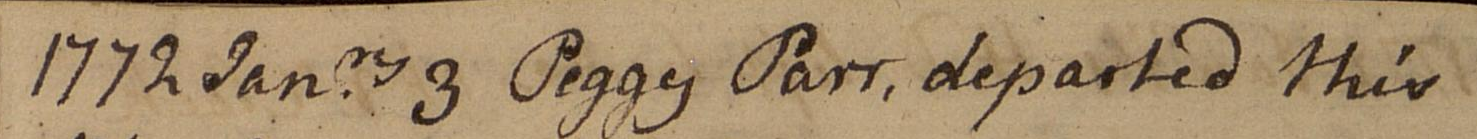1772 Jan^ry. 3 Peggy Parr, departed this
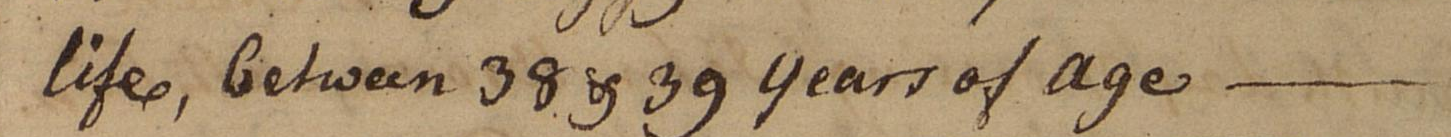life, between 38 & 39 years of age-
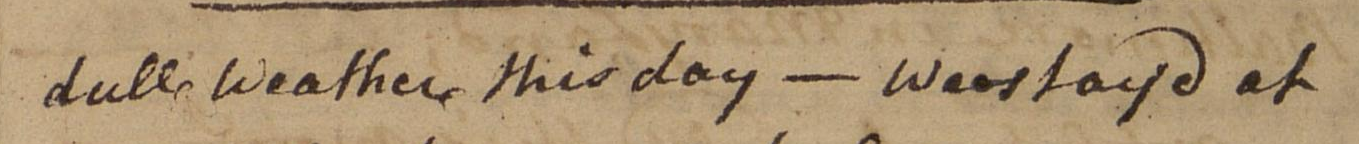dull Weather this day- Wee stay'd at
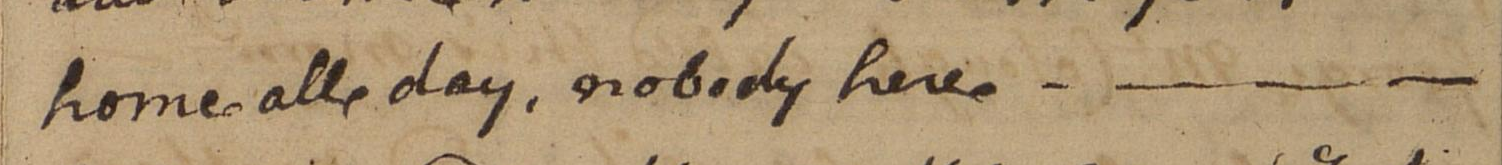home all day, nobody here-
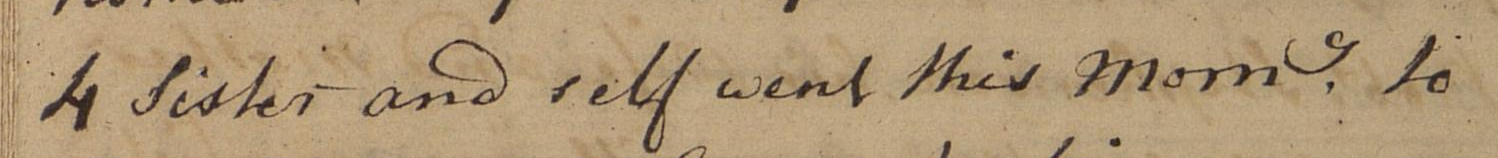4 Sister and self went this morn^g. to
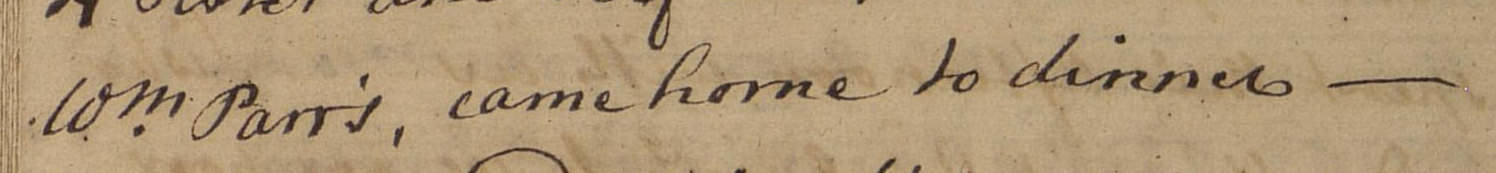W^m. Parr's, came home to dinner-
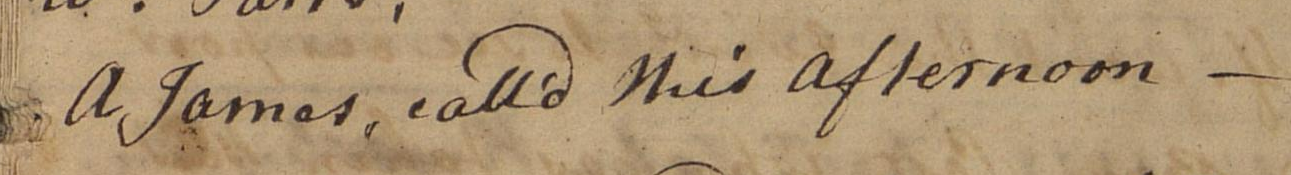A James, call'd this Afternoon-
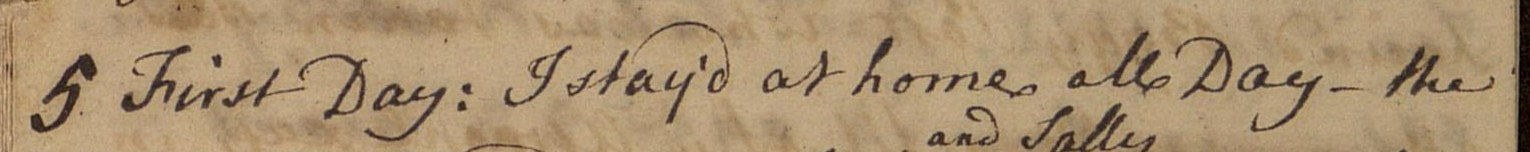5 First Day: I stay'd at home all Day- the
